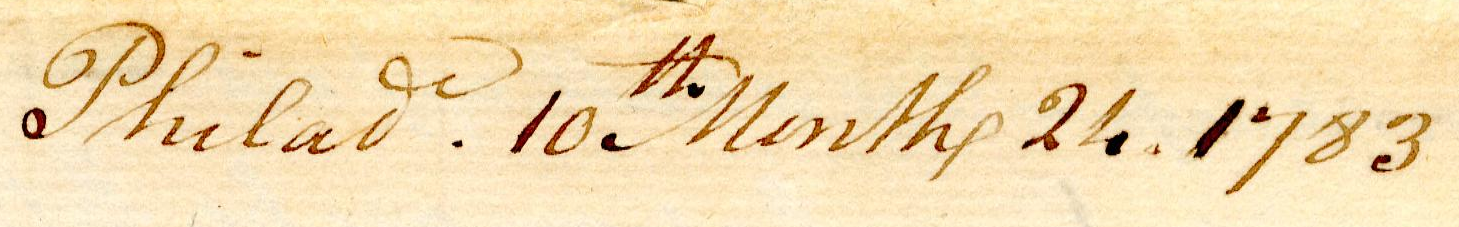Philad^a. 10^th: Month 24. 1783
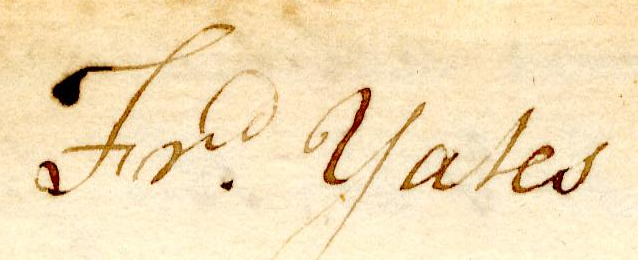Fr^d. Yates
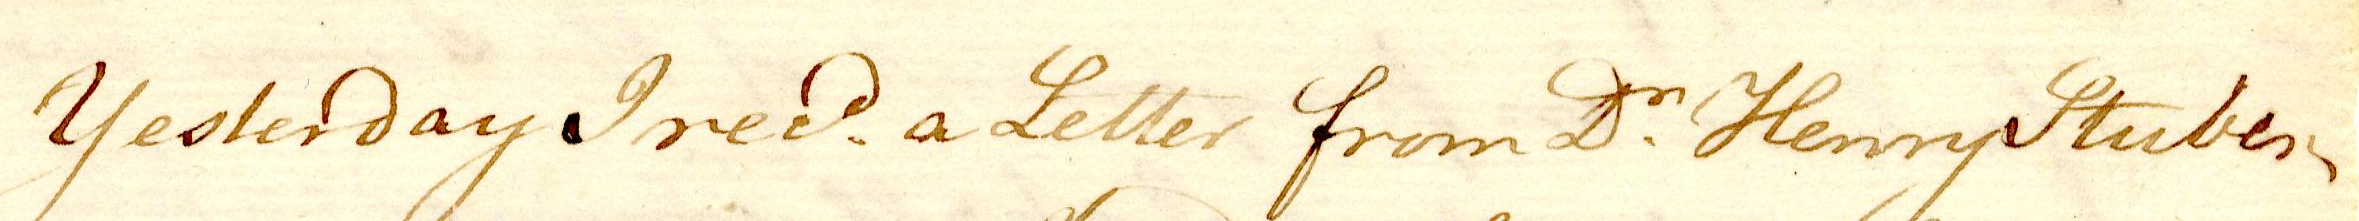Yesterday I rec^d. a Letter from D^r. Henry Stuber
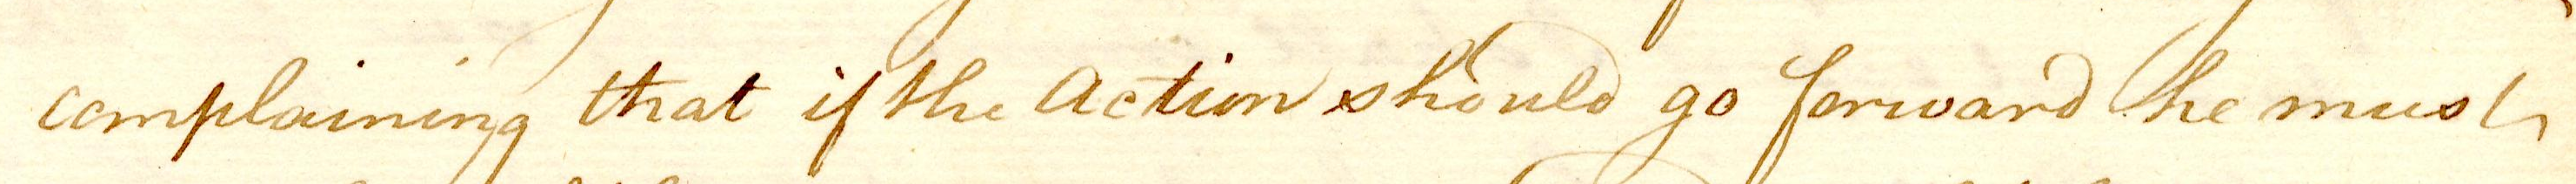complaining that if the Action should go forward he must
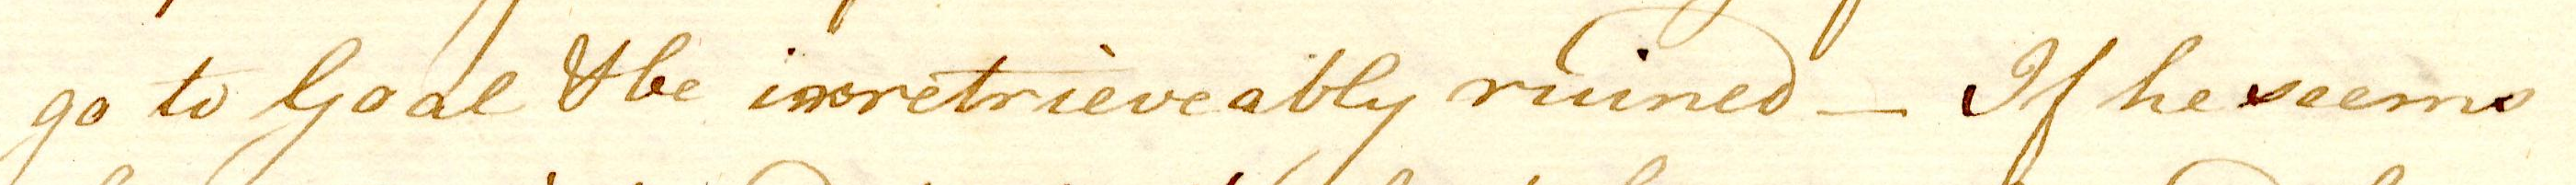go to Goal & be irretrieveably ruined. If he seems
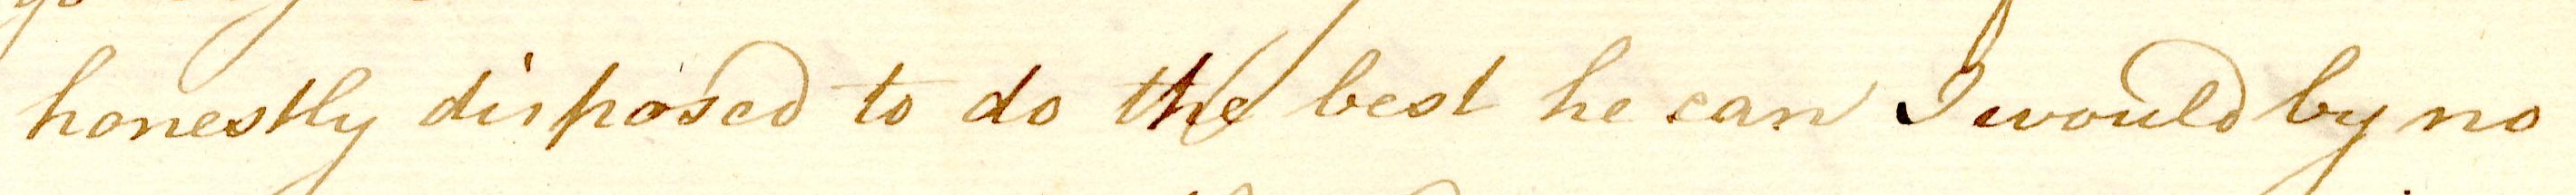honestly disposed to do the best he can I would by no
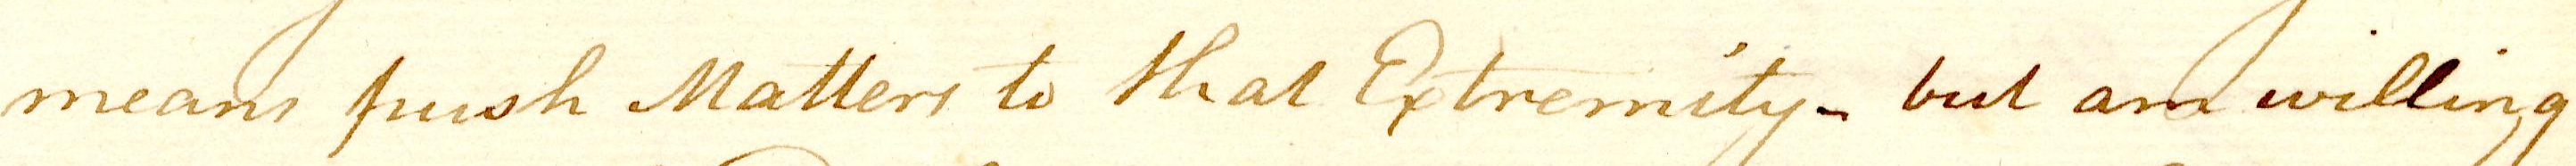means push Matters to that Extremity, but am willing,
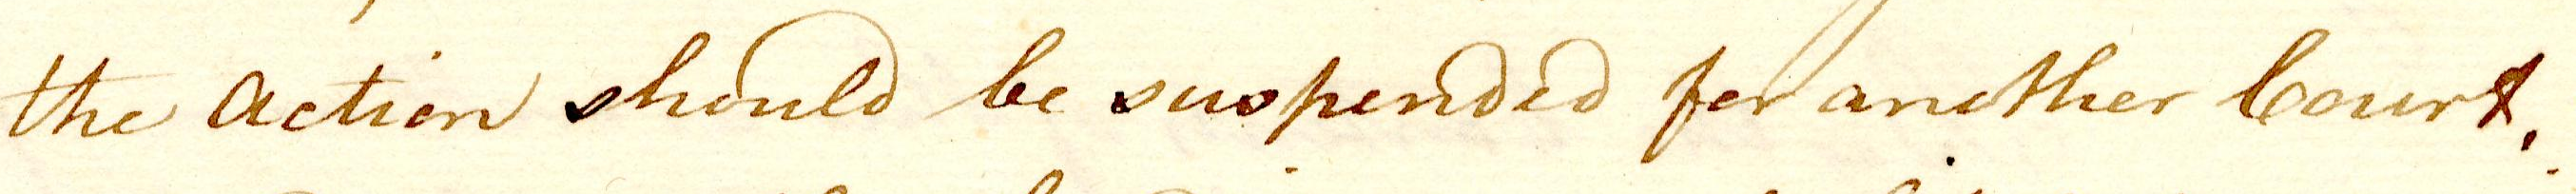the Action should be suspended for another Court.
